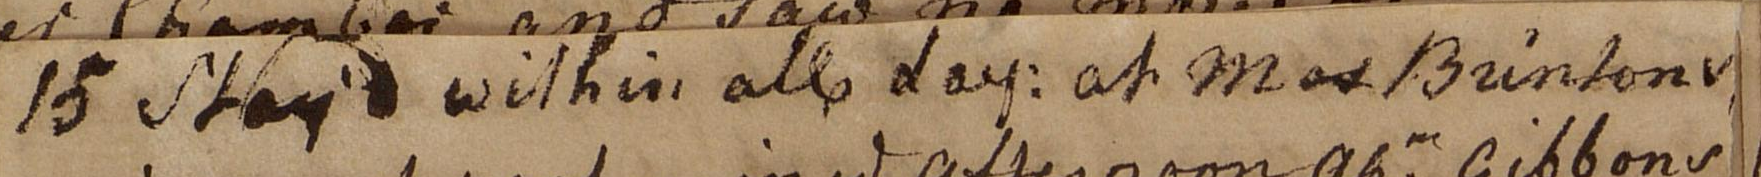15 Stay'd within all day: at Mas Brintons,
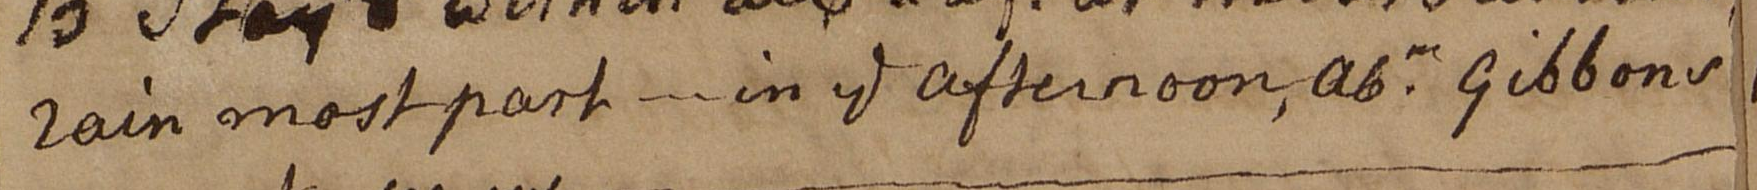rain most part- in y^e afternoon, Ab^m. Gibbons
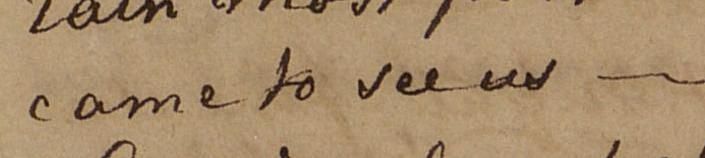came to see us-
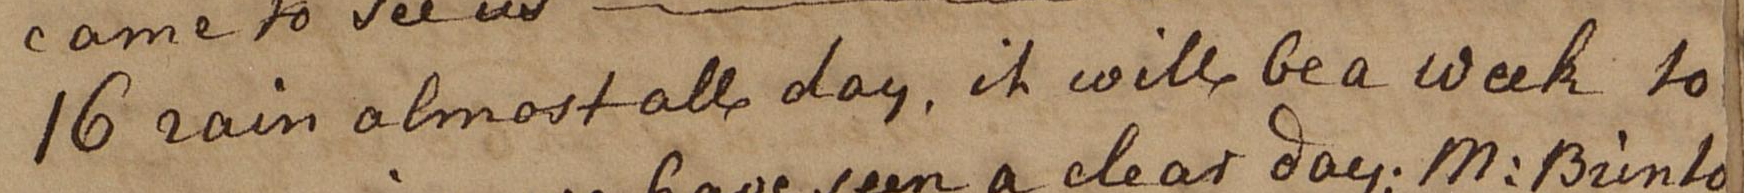16 rain almost all day, it will be a week to
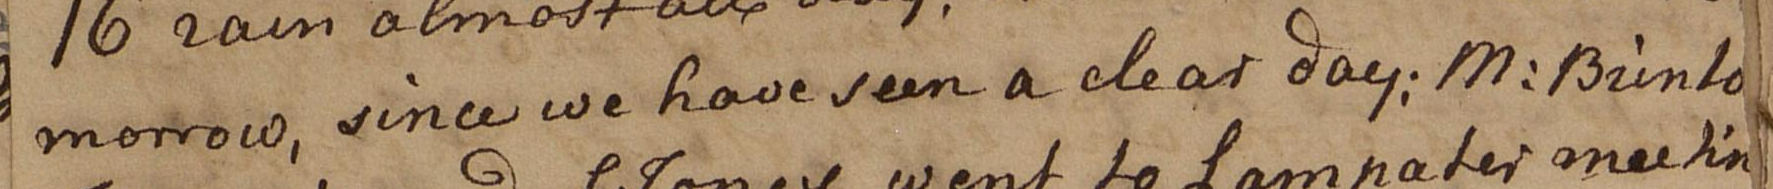morrow, since we have seen a clear day; M: Brinto
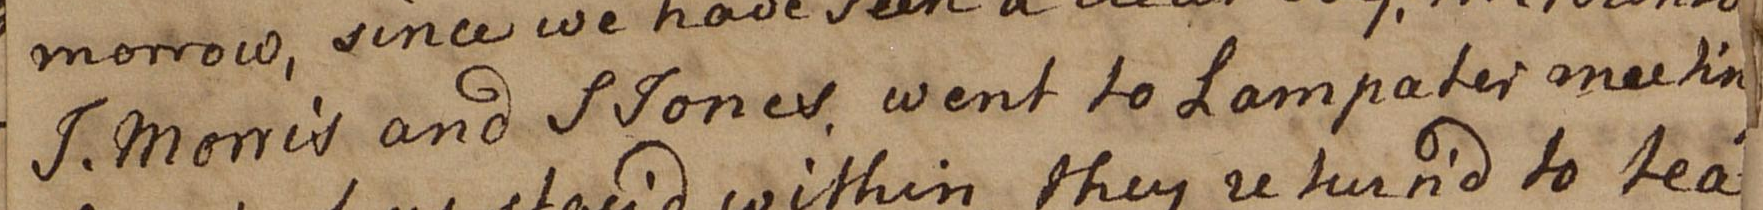T. Morris and S Jones, went to Lampater meetin
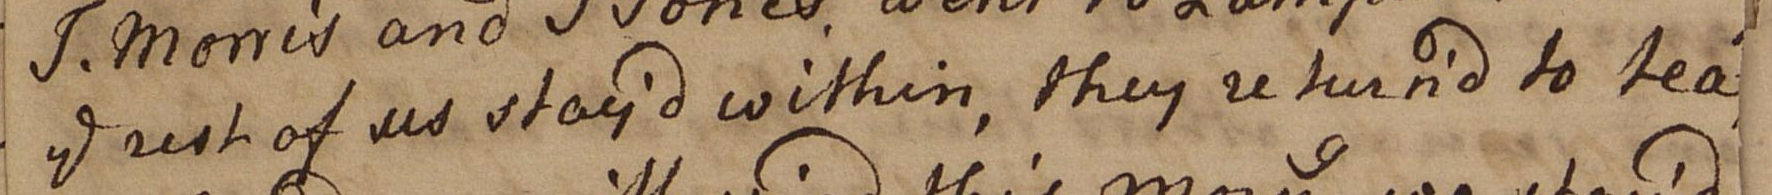y^e rest of us stay'd within, they return'd to tea
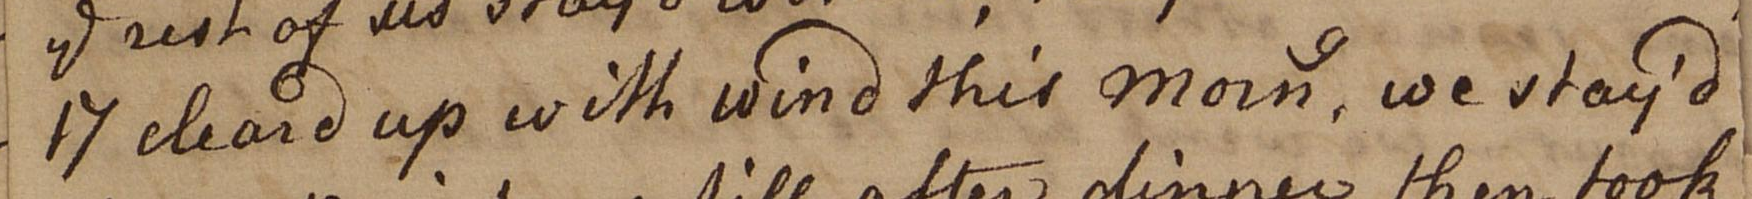17 cleard up with wind this morn^g, we stay'd
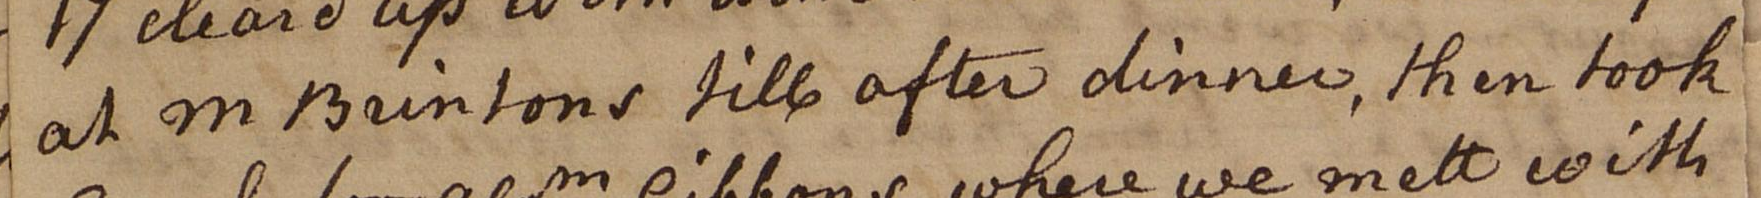at M Brintons till after dinner, then took
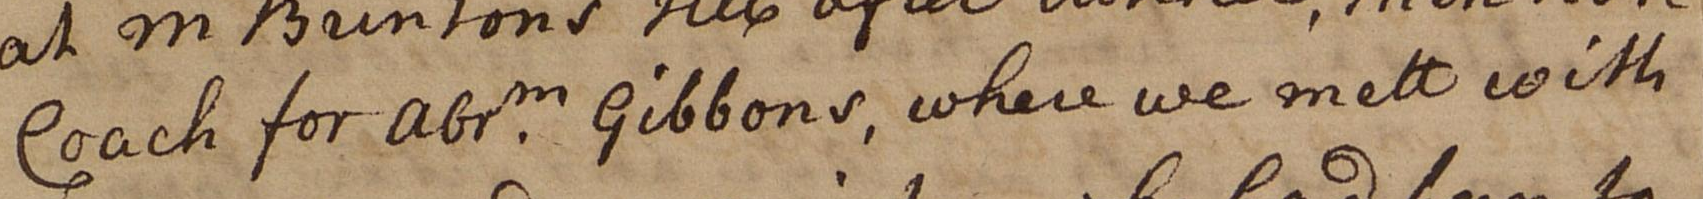Coach for Abr^m. Gibbons, where we mett with
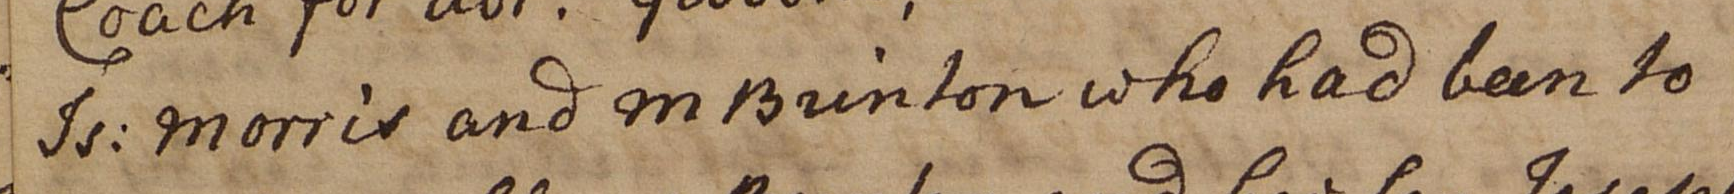Is: Morris and M Brinton who had been to
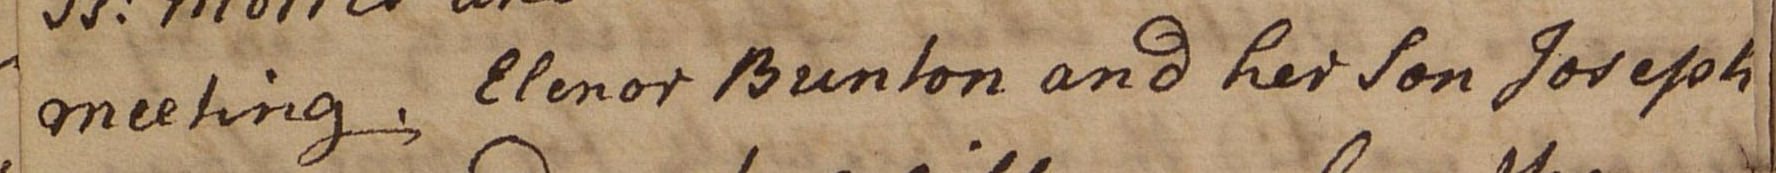meeting. Elenor Bunton and her son Joseph
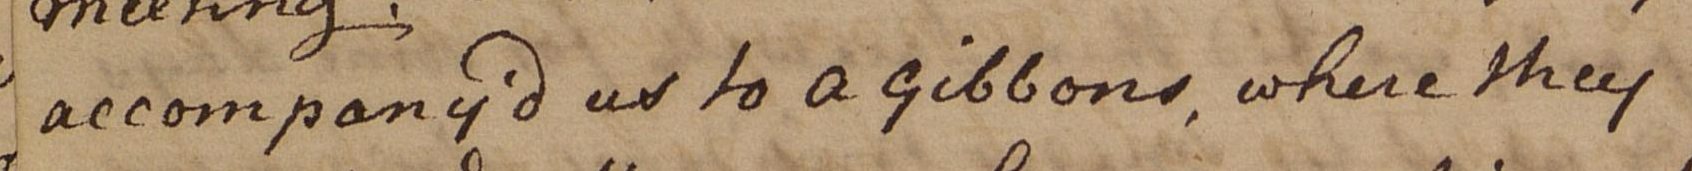accompany'd us to a Gibbons, where they
